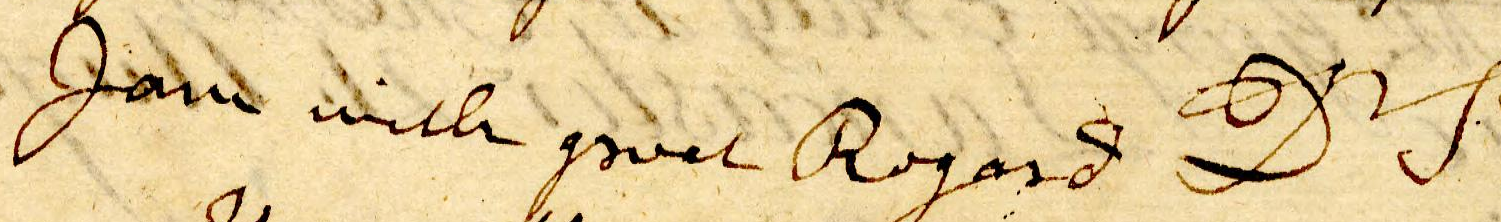I am with great Regard D^r S^r
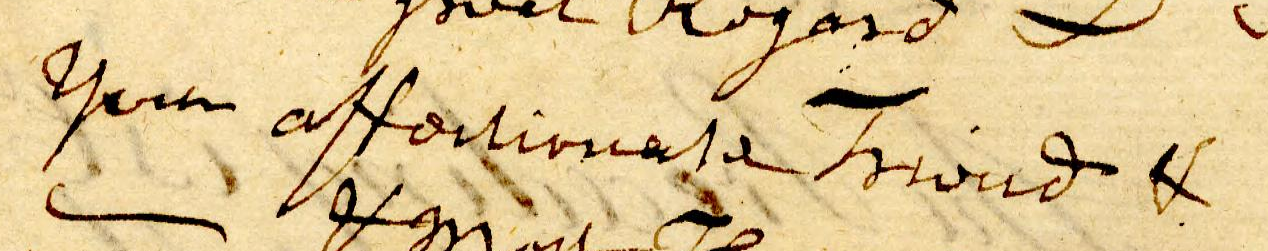Your affectionate Friend &
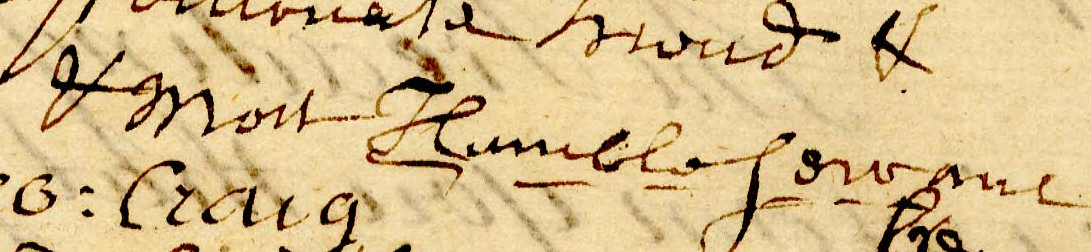& Most Humble Servant
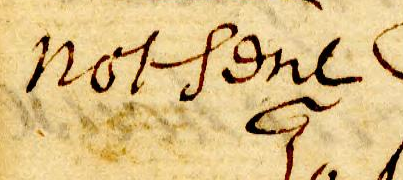Not Sent
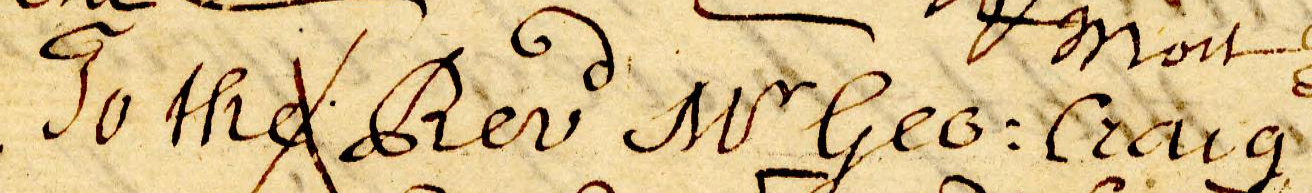To the Rev^d M^r Geo: Craig
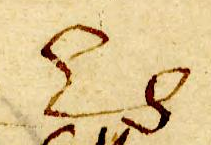ES
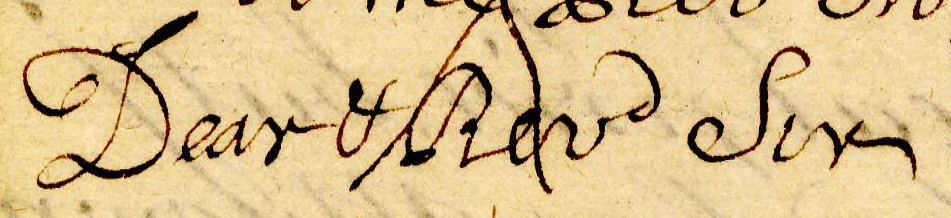Dar & Rev^d Sir
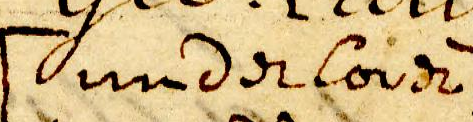under Cover
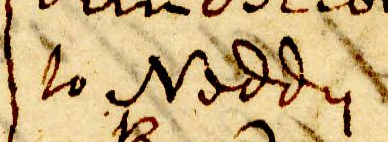to Neddy
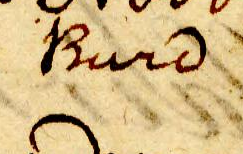Burd
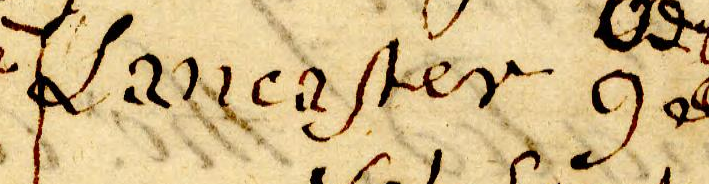Lancaster 9
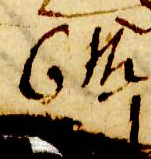6^th
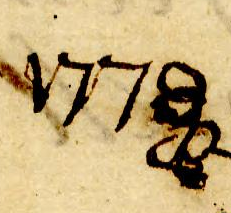1778
